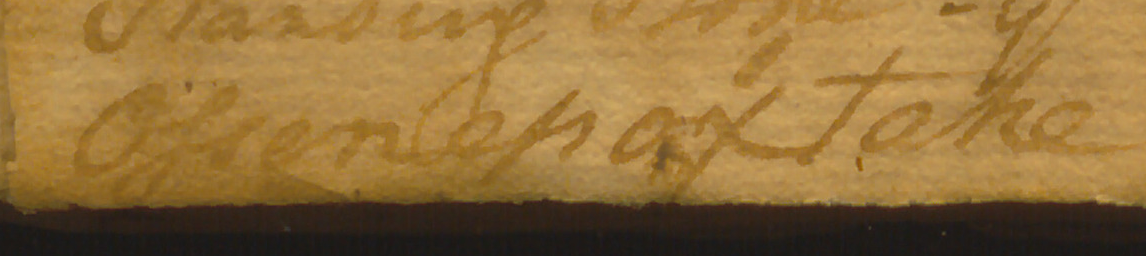Ossenepoxtone
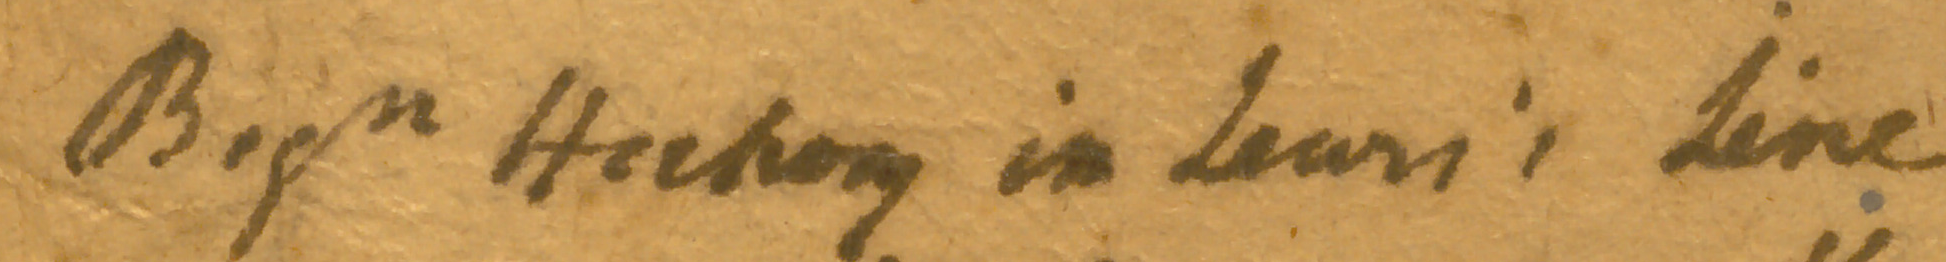Beg^n Hickory in Lears's Line
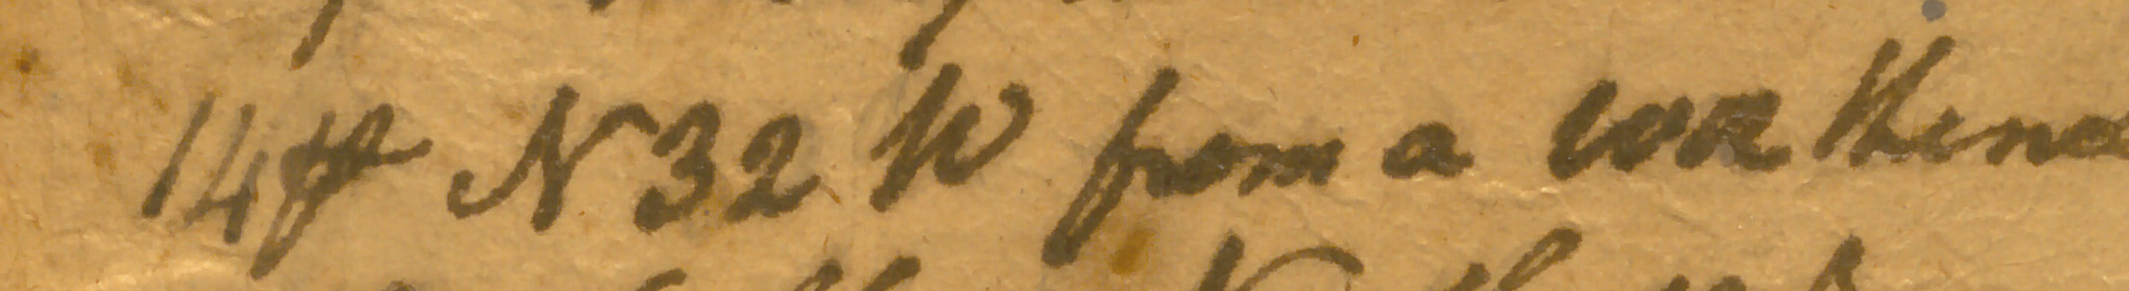14 per N32W from a W0h thence
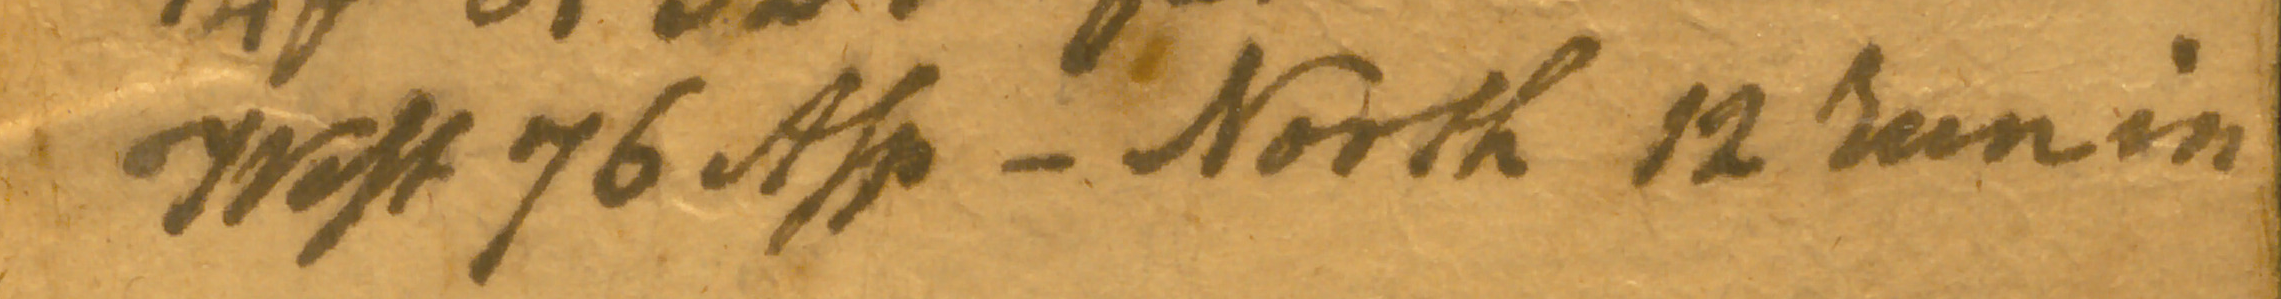West 76 Also - North 12 been in
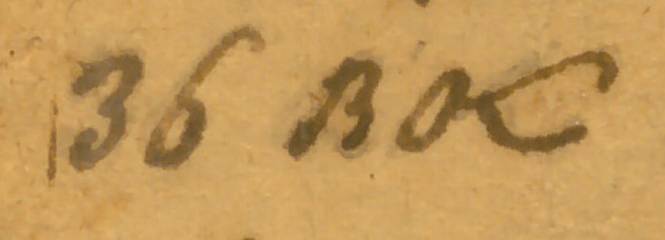36 B
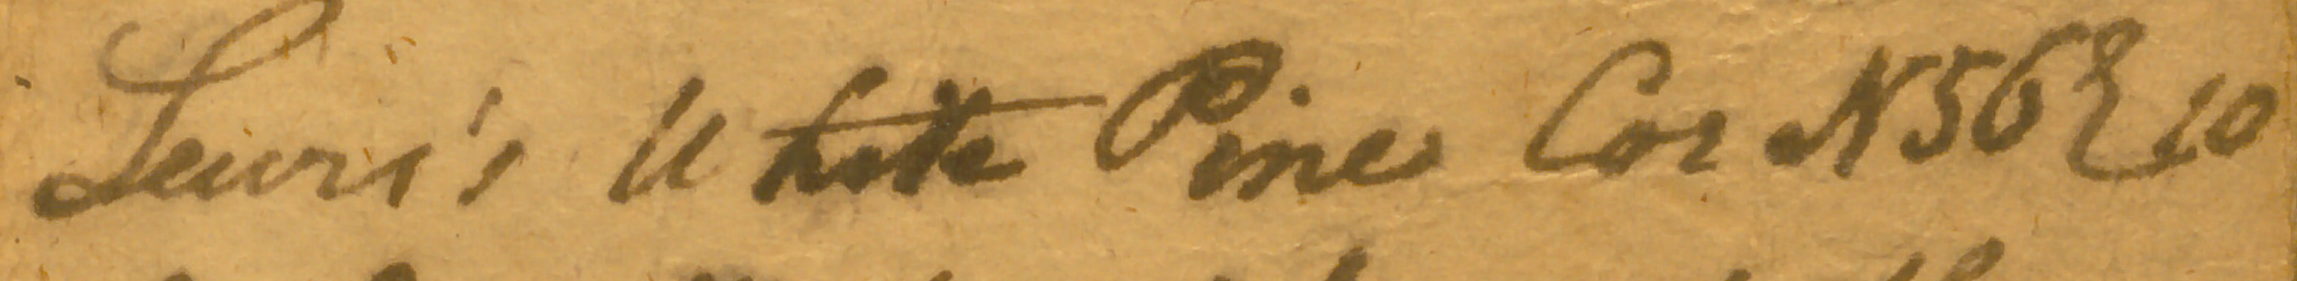Leurs's U hate Pine Cor N 56 10
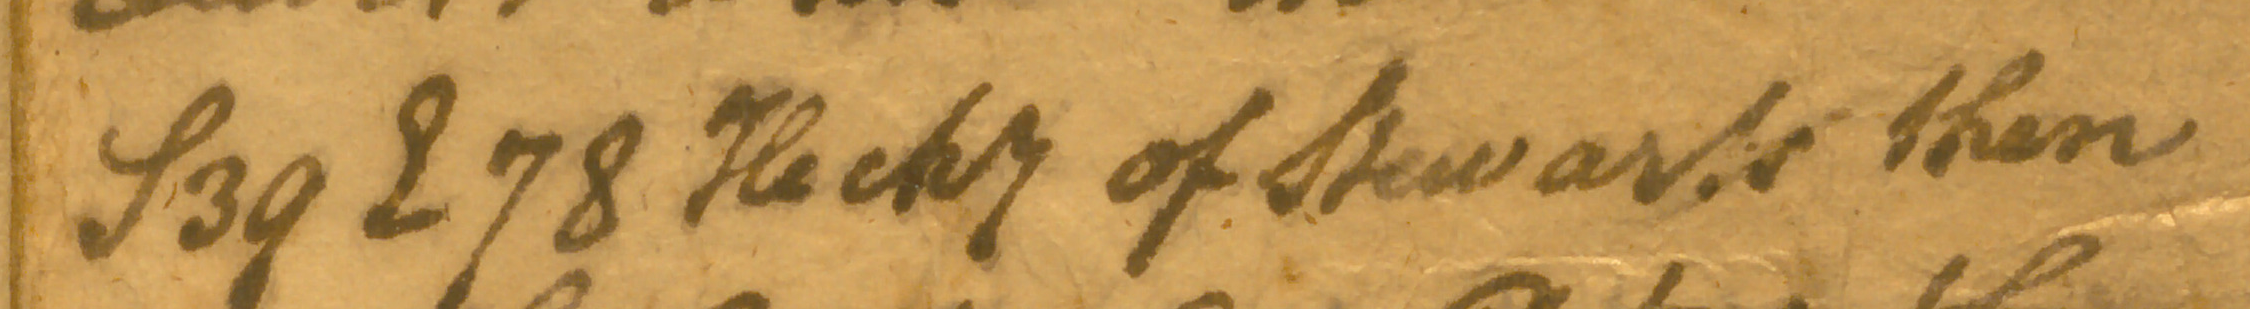S39 L78 Hecky of Stewarts then
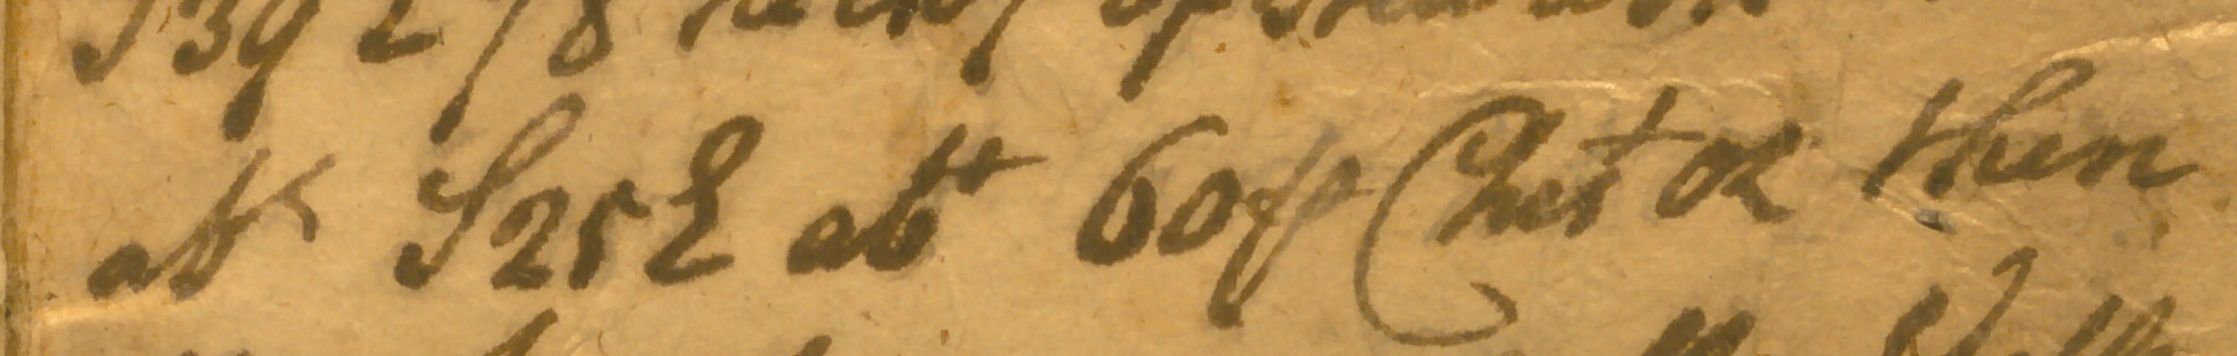at S25L ab^t 60per Ches^t OR there
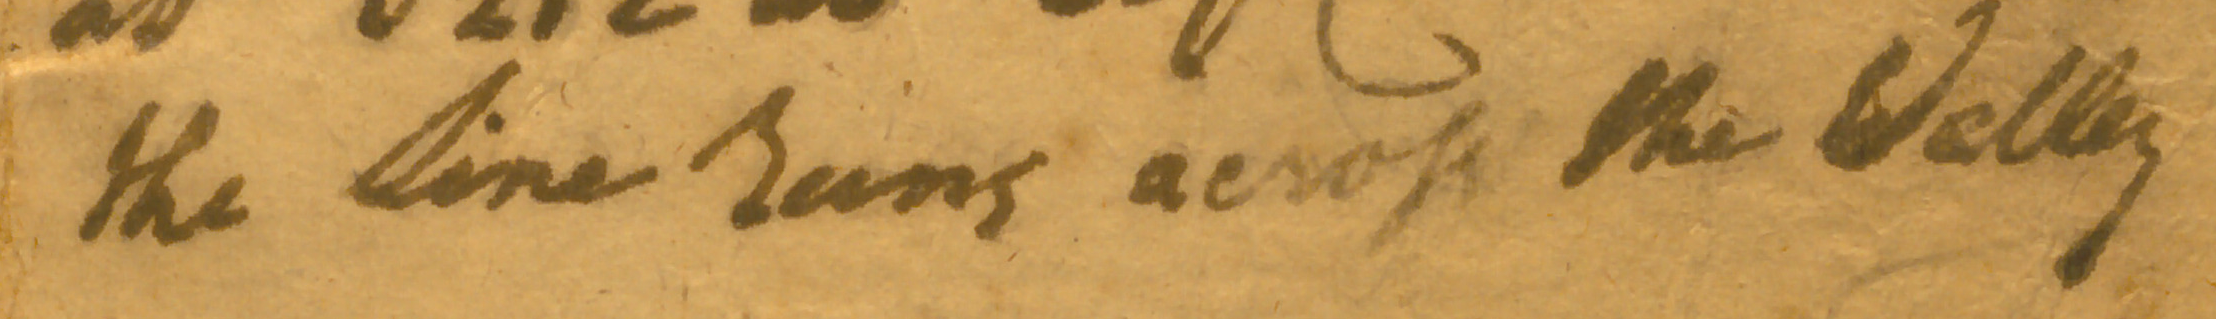the Pine Runs across the Valley
